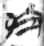於
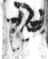申
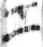工（空）
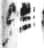於
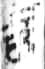梄（酉）
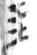坐
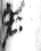於
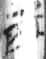戌
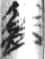盍（蓋）
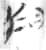於
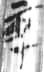亥
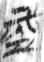城（成）
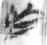於
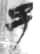子
